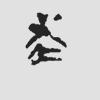蒼
